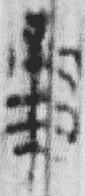甬（用）
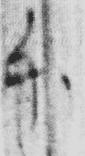力
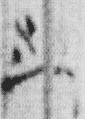之
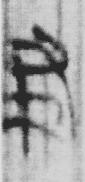○（盡）
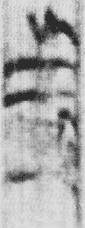者
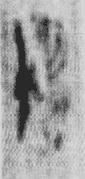利（利）
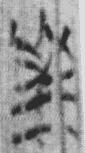爲
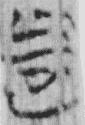甚
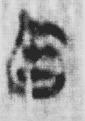目
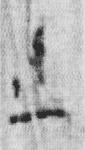之
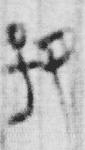好
